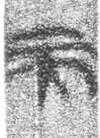天
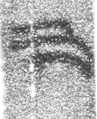下
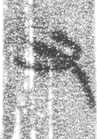又（有）
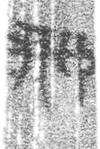哉
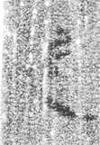民
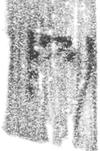則（則）
